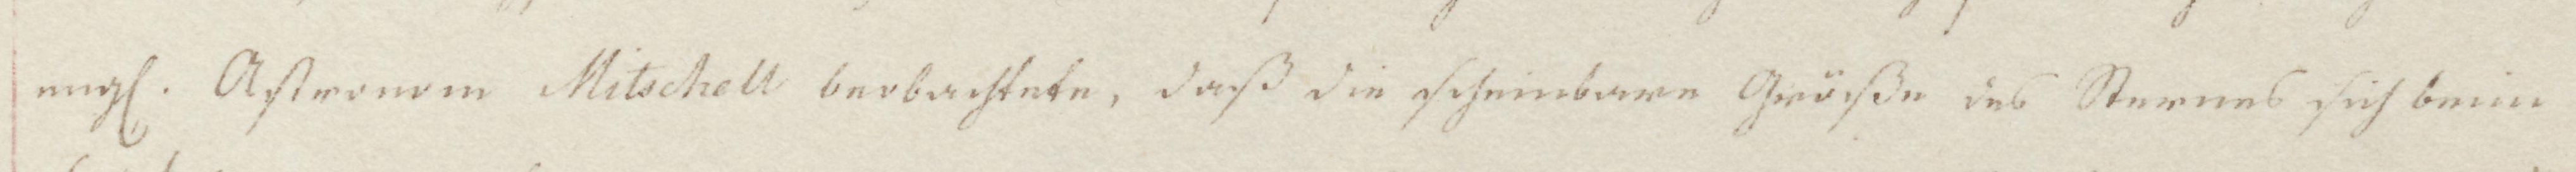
engl. Astronom Mitchell beobachtete, daß die scheinbare Größe des Sterns sich beim
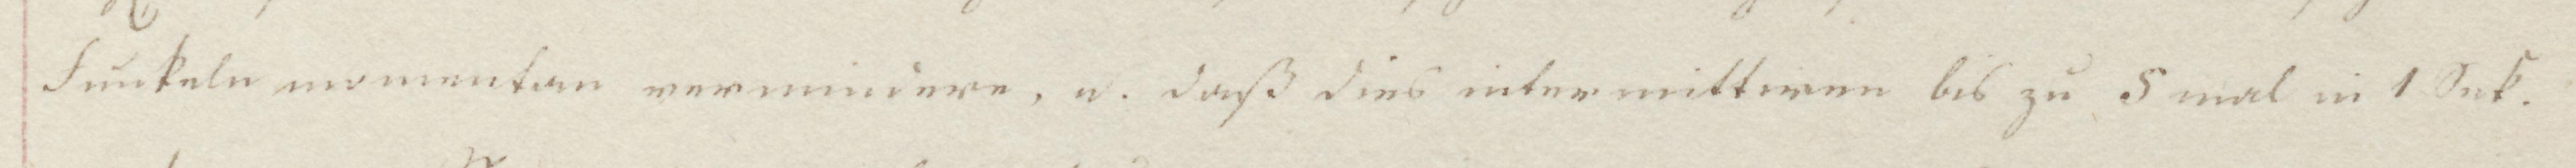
Funkeln momentan vermindere, u. daß dies intermittiren bis zu 5 mal in 1 Sek.
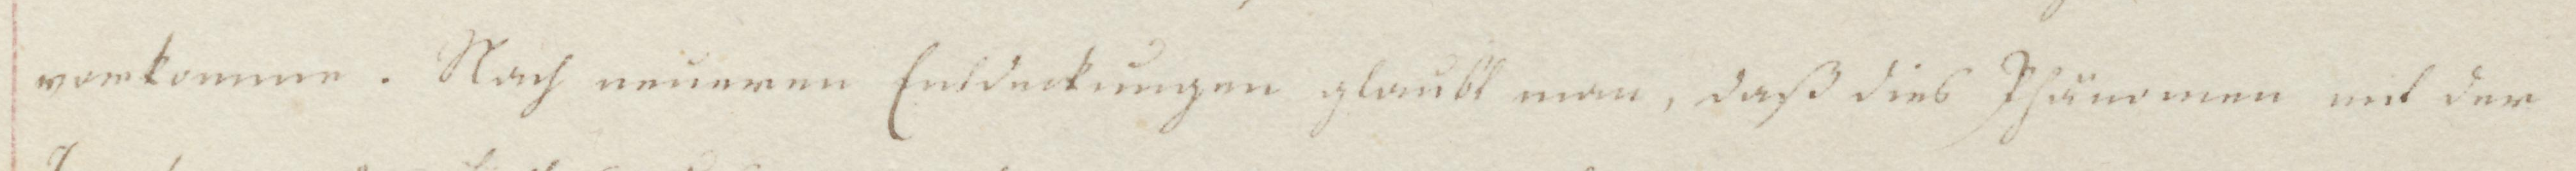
vorkomme. Nach neueren Entdeckungen glaubt man, daß dies Phänomen mit der
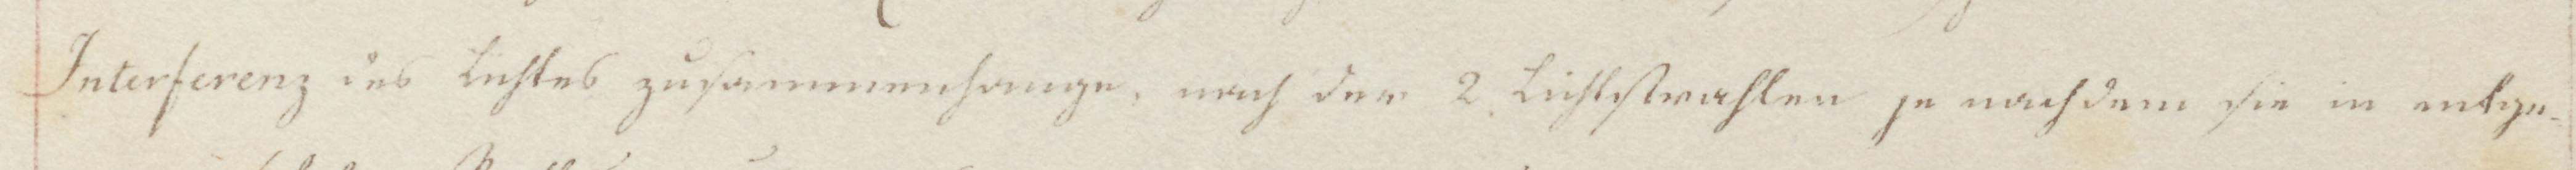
Interferenz des Lichtes zusammenhange, nach der 2 Lichtstrahlen je nachdem sie in entge-
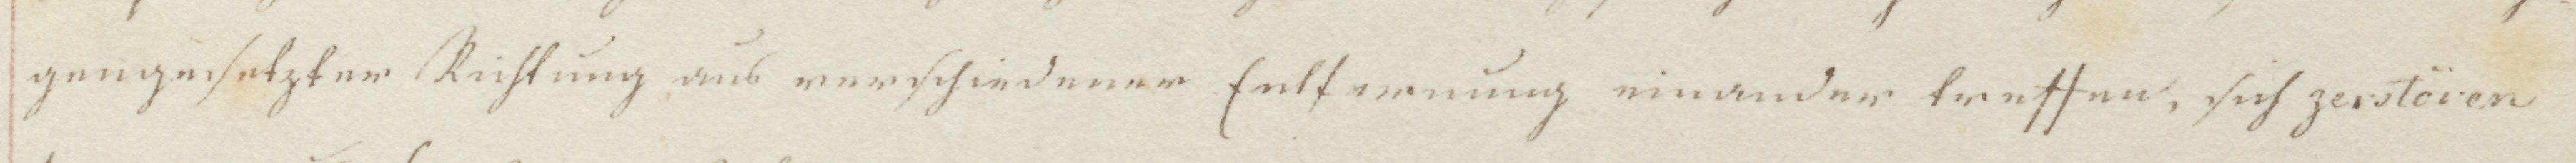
gengesetzter Richtung aus verschiedener Entfernung einander treffen, sich zerstören
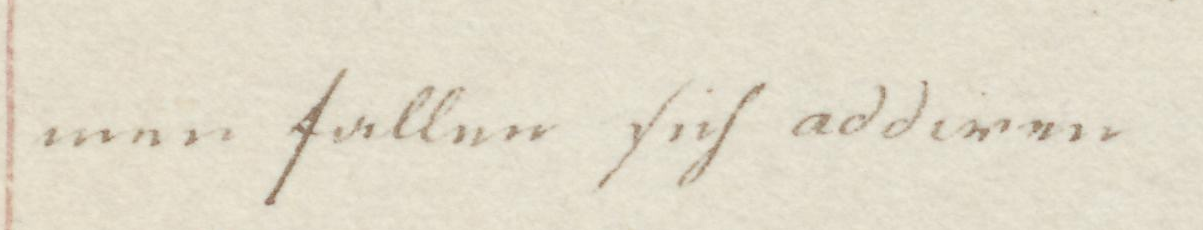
men fallen sich addiren.
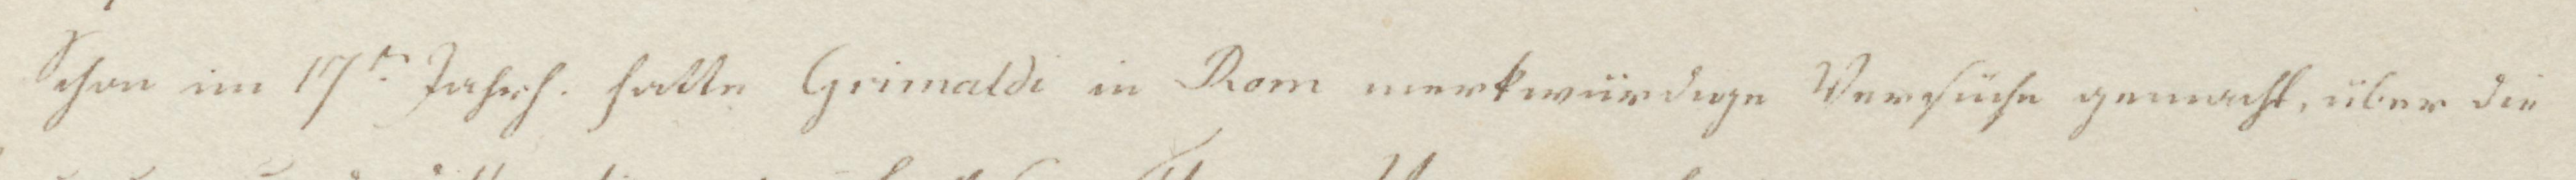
Schon im 17t￼ Jahrh. hatte Grimaldi in Rom merkwürdige Versuche gemacht, über die
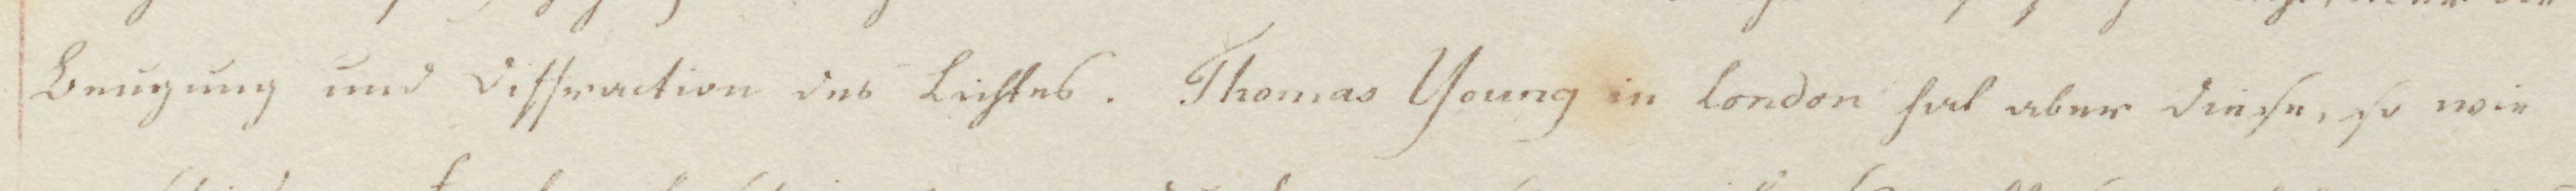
Beugung und Diffraction des Lichtes. Thomas Young in London hat aber diese, so wie
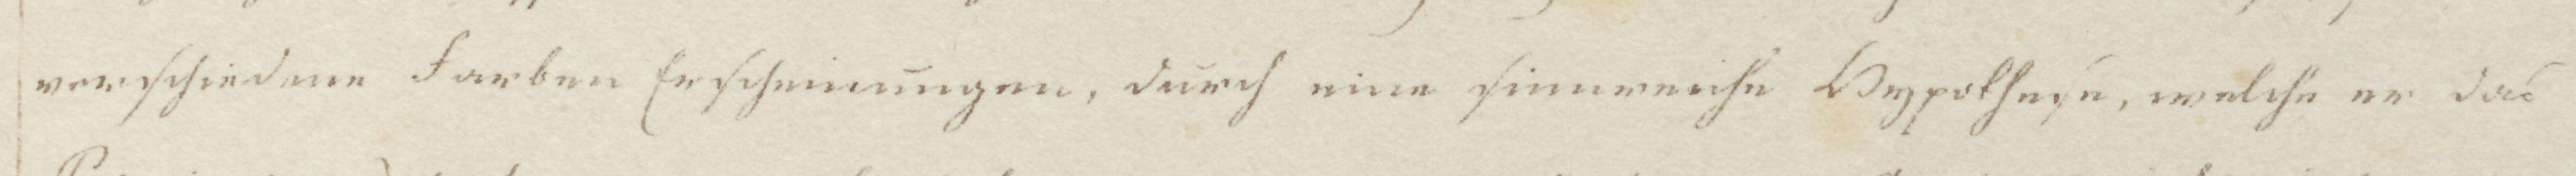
verschiedene Farben Erscheinungen, durch eine sinnreiche Hypothese, welche er das
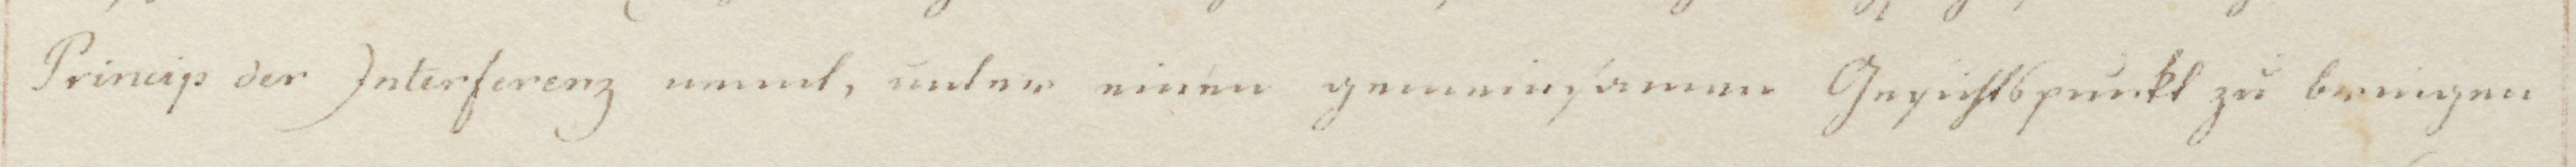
Princip der Interferenz nennt, unter einen gemeinsamen Gesichtspunkt zu bringen
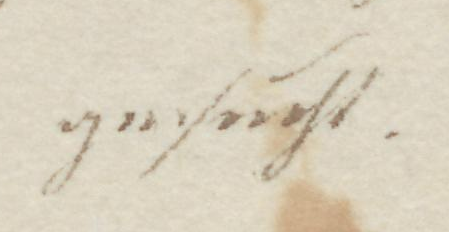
gesucht.
